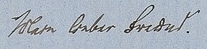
Mein lieber Freund.
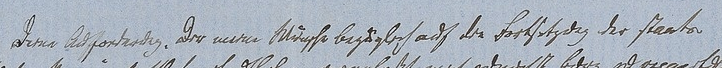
Deine Aufforderung, Dir meine Wünsche bezüglich auf die Fortsetzung der staats-
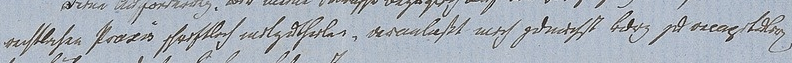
rechtlichen Praxis schriftlich mitzutheilen, veranlaßt mich zunächst kurz zu recapituliren,
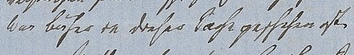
was bisher in dieser Sache geschehen ist.
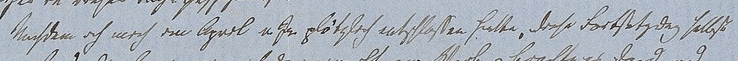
Nachdem ich mich im April v. Jr. plötzlich entschlossen hatte, diese Fortsetzung selbst
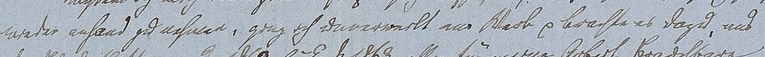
wieder anhand zu nehmen, ging ich unverweilt ans Werk & brachte es dazu, aus
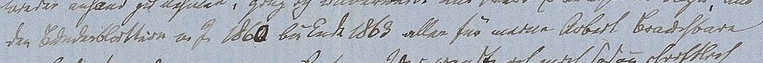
den Bundesblättern v. J. 1860 bis Ende 1863 alles für meine Arbeit Brauchbare
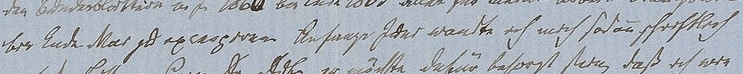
bis Ende Mai zu excerpiren. Anfangs Juni wandte ich mich sodann schriftlich
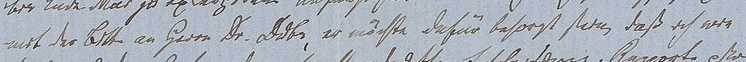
mit der Bitte an Herrn Dr. Dubs, er möchte dafür besorgt sein, daß ich wie
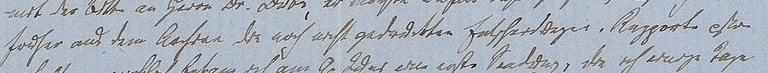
früher aus dem Archive die noch nicht gedruckten Entscheidungen, Rapporte etca
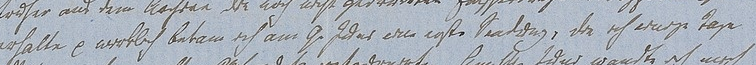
erhalte & wirklich bekam ich am 9. Juni eine erste Sendung, die ich einige Tage
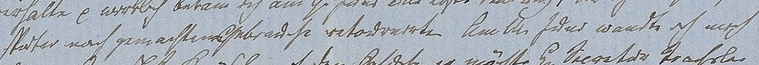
später nach gemachtem Gebrauche retournirte. Am 14. Juni wandte ich mich
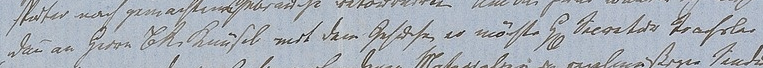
dann an Herrn BR. Knüsel mit dem Gesuche, er möchte Hrn Secretär Trachsler
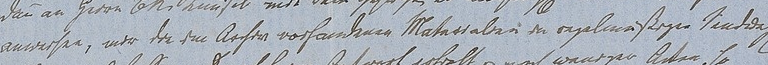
anweisen, mir die im Archive vorhandenen Materialien in regelmäßigen Sendungen
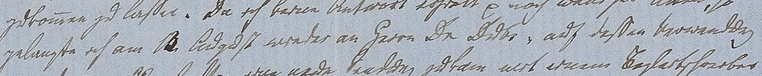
gelangte ich am 13. August wieder an Herrn Dr Dubs, auf dessen Verwendung
